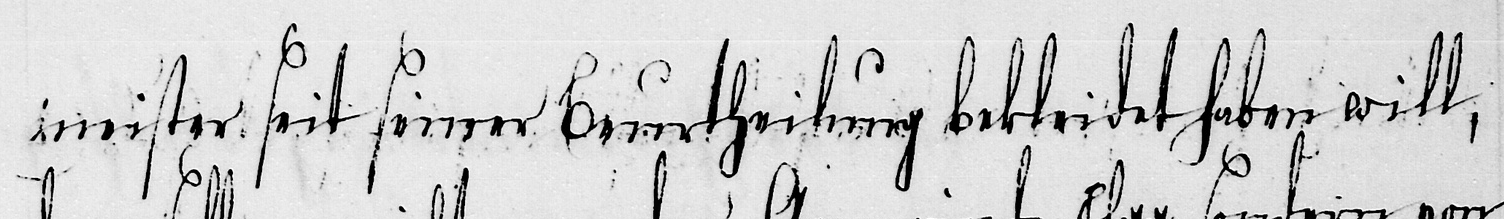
meister seit seiner Beurtheilung bekleidet haben wil¬
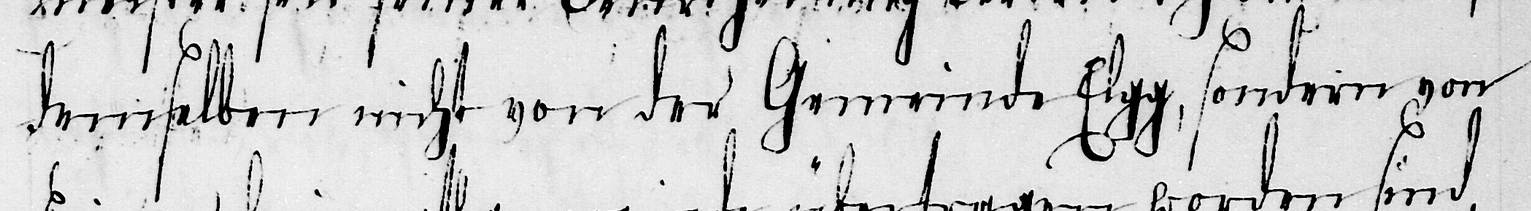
demselben nicht von der Gemeinde Elgg, sondern von
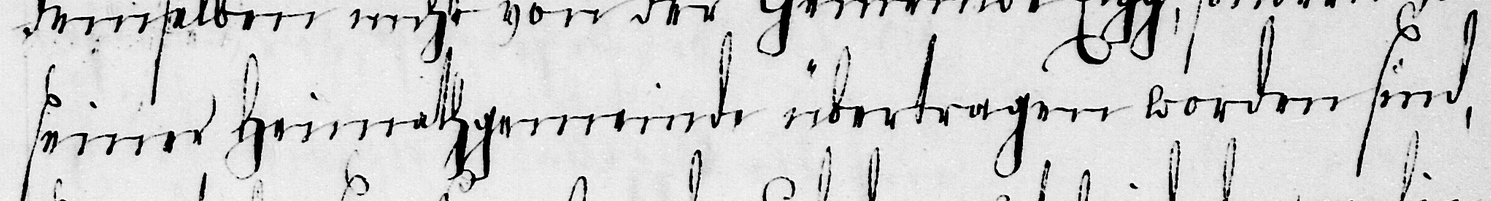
seiner Heimathgemeinde übertragen worden sind,
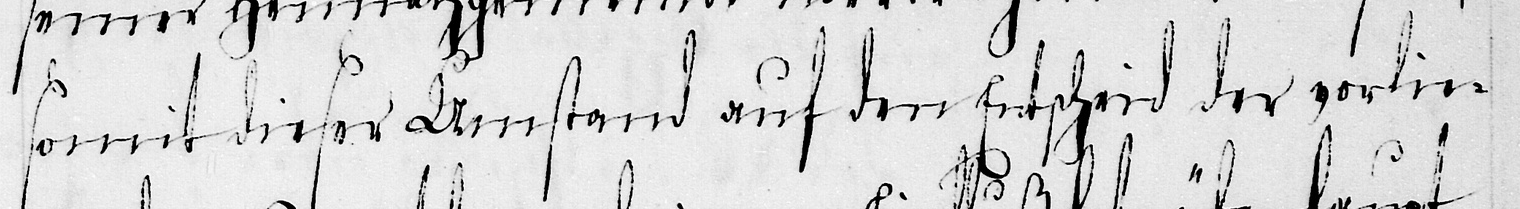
somit dieser Umstand auf den Entscheid der vorlie¬
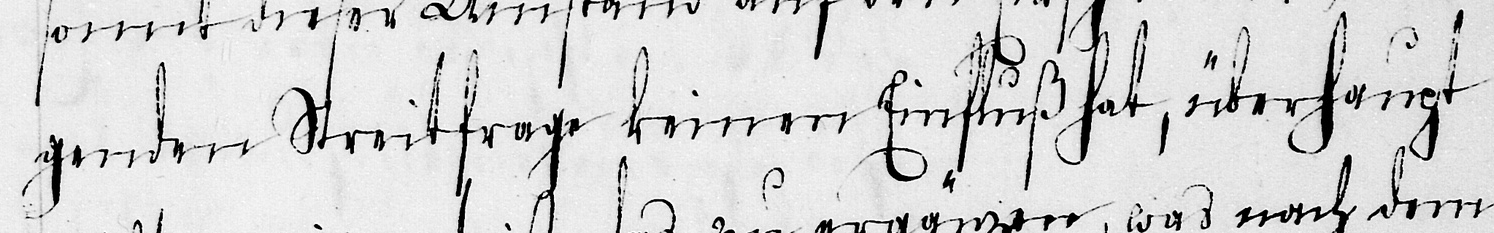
genden Streitfrage keinen Einfluß hat, überhaupt
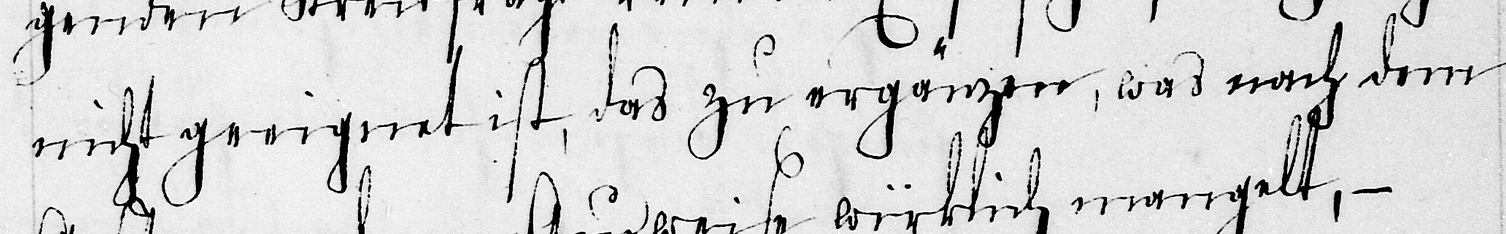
nicht geeignet ist, das zu ergänzen, was nach dem
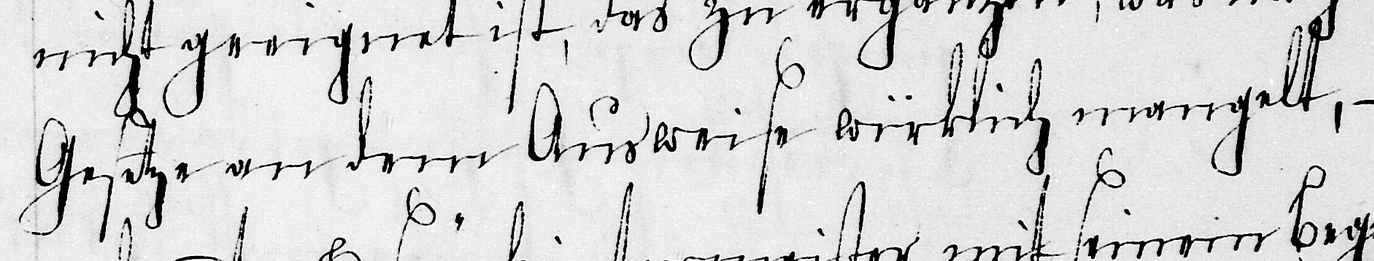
Gesetze an dem Ausweise wirklich mangelt,
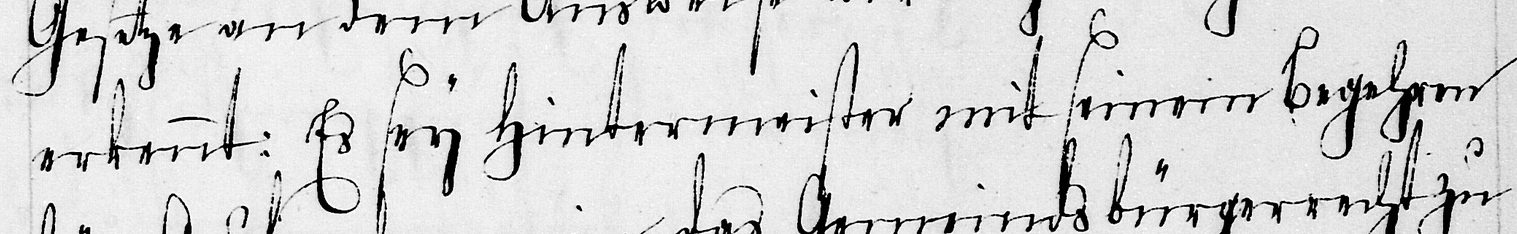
erkennt: Es sey Hintermeister mit seinem Begehren
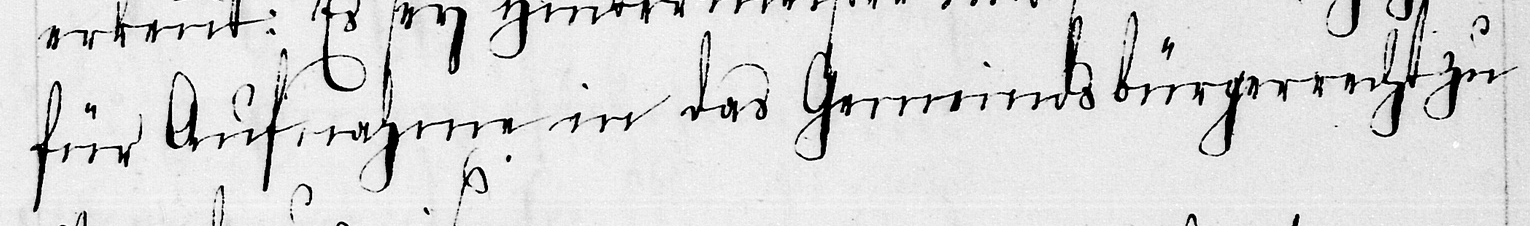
für Aufnahme in das Gemeindsbürgerrecht zu
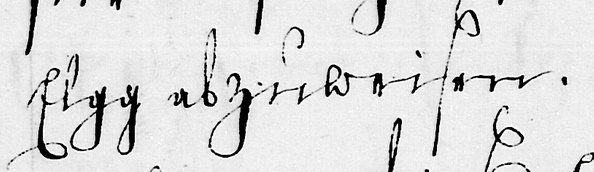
Elgg abzuweisen.
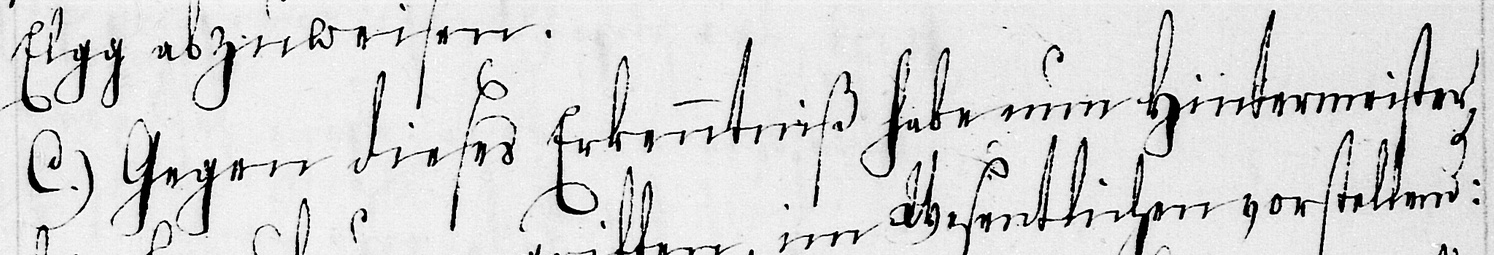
C.) Gegen dieses Erkenntniß habe nun Hintermeister
